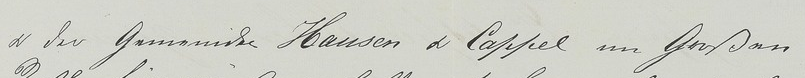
& der Gemeinden Hausen & Cappel im Großen
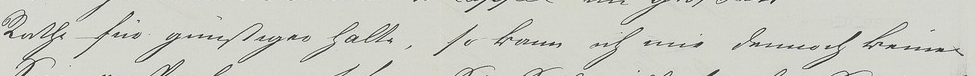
Rathe für günstiger halte, so kann ich mir dennoch keinen
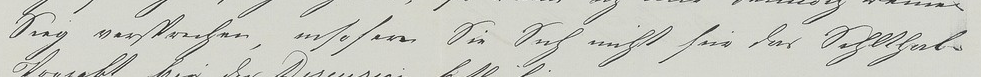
Sieg versprechen, insofern Sie Sich nicht für das Sihlthal-
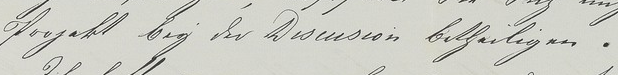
Projekt bey der Discussion betheiligen.
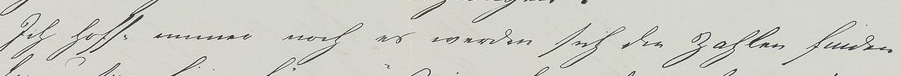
Ich hoffe immer noch es werden sich die Zahlen finden
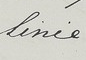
Linie.
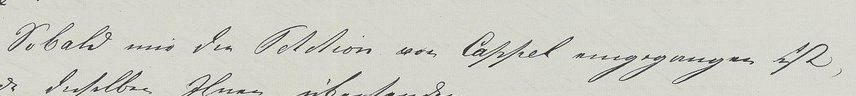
Sobald mir die Petition von Cappel eingegangen ist,
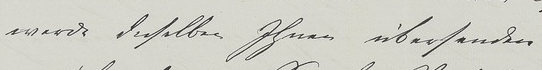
werde dieselben Ihnen übersenden.
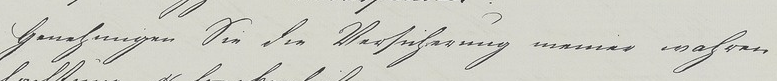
Genehmigen Sie die Versicherung meiner wahren
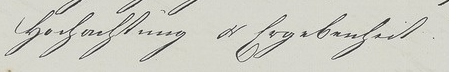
Hochachtung & Ergebenheit.
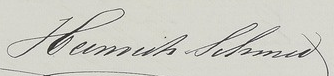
Heinrich Schmid
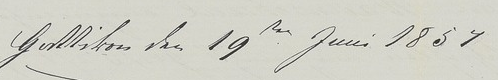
Gattikon den 19ten Juni 1857
